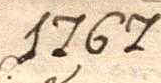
1767
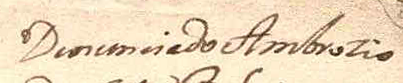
Denunciado Ambrozio
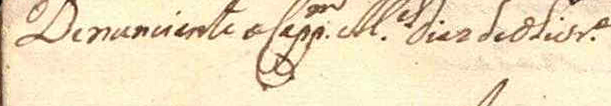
o Denunciante o Capp.m M.el dias de OLivr.a
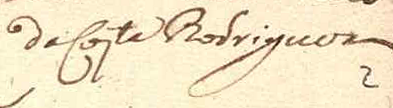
da Costa Rodriguez
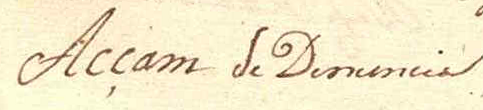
Acçam de Denuncia
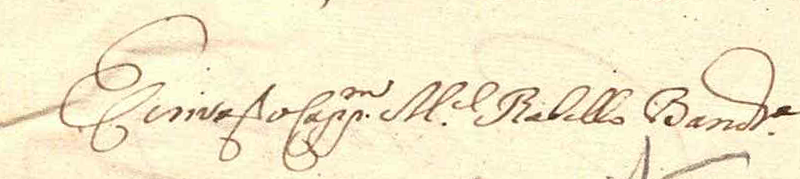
Escrivaõ o Capp.m M.el Rabello Bandr.a
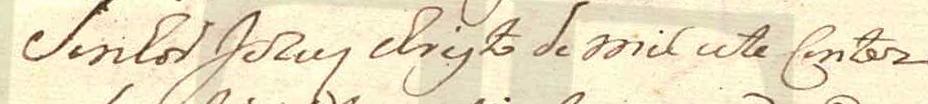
Senhor Jezus christo de mil ceteCentoz
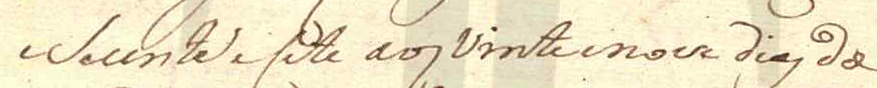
e Secenta e Cete aos vinte e nove dias do
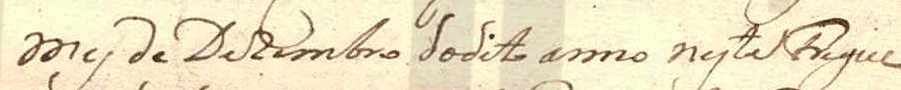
mes de Dezembro do dito anno nesta Fregue
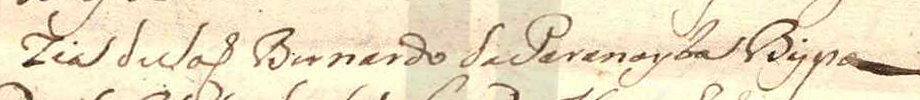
Zia de Saõ Bernardo da Paranayba Bispa
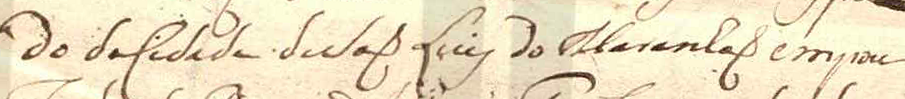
do da Cidade de Saõ Luis do Maranhaõ em pou
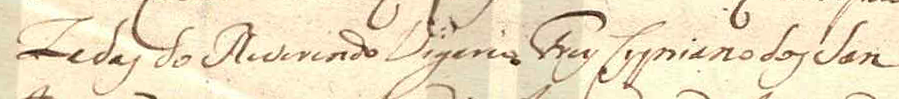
Zadas do Reverendo Vigario Frey Cypriano dos San
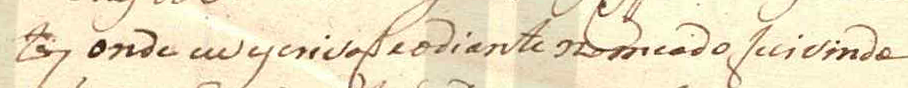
tos onde eu escrivaõ ao diante nomeado fui vindo
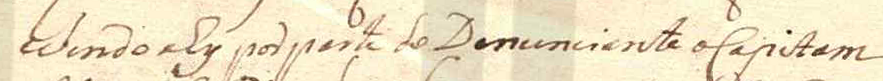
e sendo ahy por parte do Denunciante o Capitam
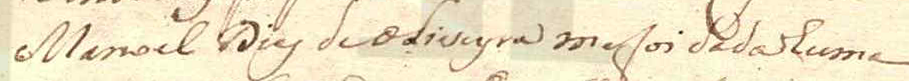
Manoel Dias de OLiveyra me foi dada huma
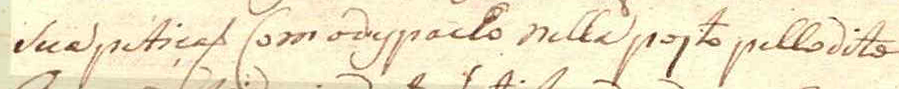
sua petiçaõ Com o despacho nella posto pello dito
